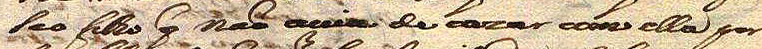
seo filho q̄ não auia de cazar com ella por
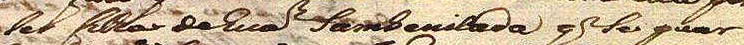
ser filha de huā sambenitada q̄ se guar
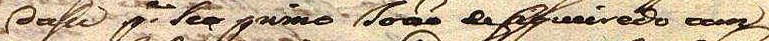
dasse p.a seo primo Ioão de figueiredo com
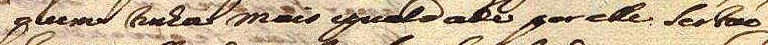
quem tinha mais egualdade por elle ser tão
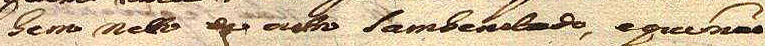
bem netto de outro sambenitado, e que não
